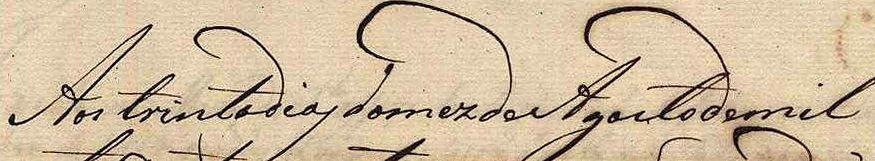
Aos trinta dias do mez de Agosto de mil
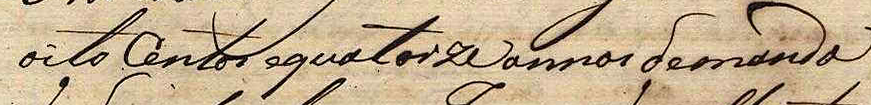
oitoCentos e quatorze annos de manda
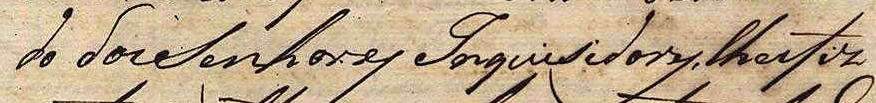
do dos Senhores Inquisidores, lhes fiz
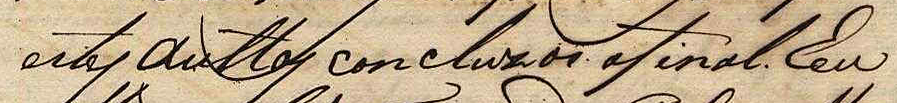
estes auttos concluzos afinal. E eu
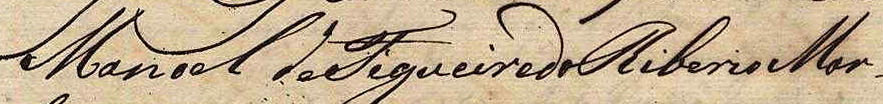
Manoel de Figueiredo Riberio Mar
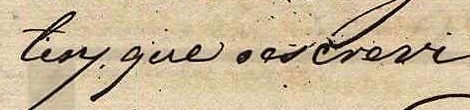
tins, que o escrevi
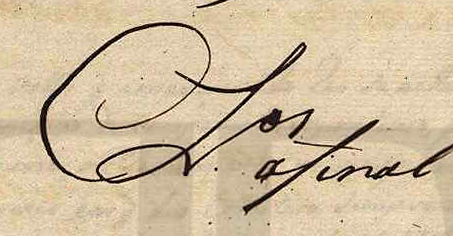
CL.os afinal
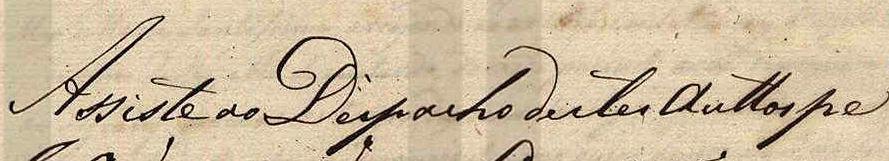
Assiste ao Despacho destes Auttos pe
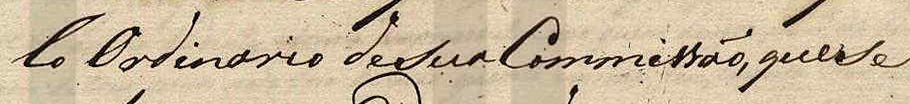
lo Ordinario de Sua Commissaõ, que se
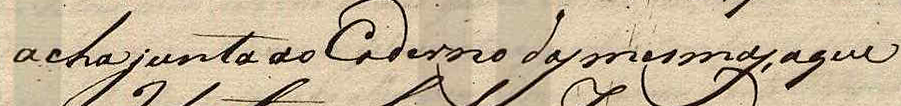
acha junta ao Caderno das mesmas, a que
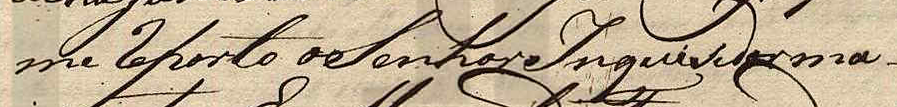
me Reporto o Senhor Inquisidor ma
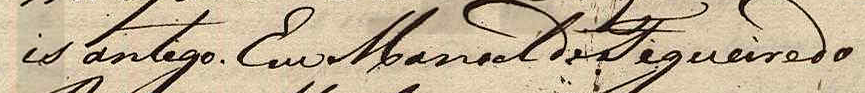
es antigo. E eu Manoel de Figueiredo
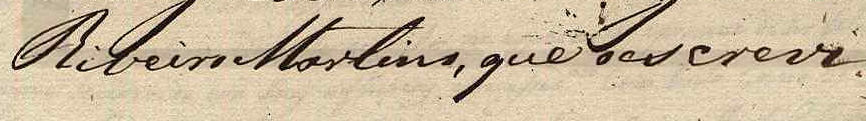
Riveiro Martins, que o escrevi.
